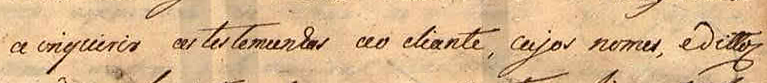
a inquerir as testemunhas aodiante, cujos nomes, e dittos
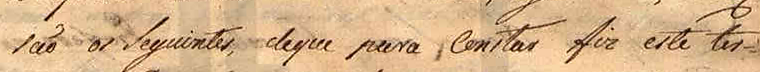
saõ os Seguintes, de que para constar fiz este ter
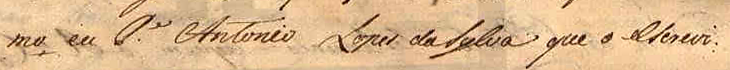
mo eu P.e Antonio Lopes da Sylva que o Escrevi.
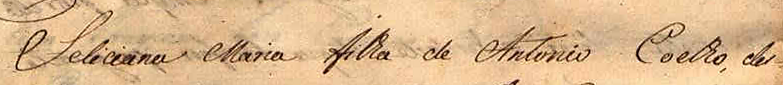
Feliciana Maria filha de Antonio Coelho, des
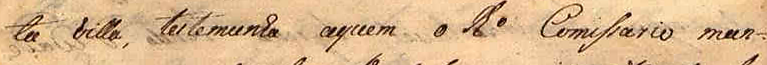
ta villa, testemunha a quem o R.o Comissario man
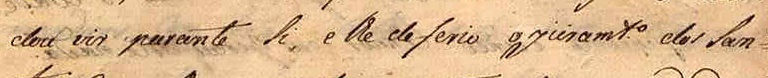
dou vir parante si e lhe deferio o juramt.o dos San
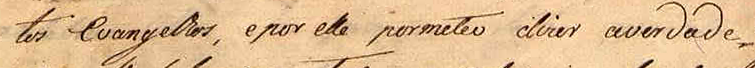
tos Evangelhos, e por elle pormeteo dizer a verdade
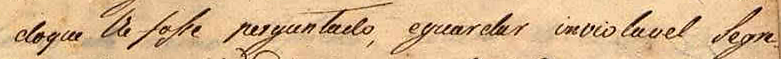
do que lhe fosse perguntado, e guardar inviolavel Segre
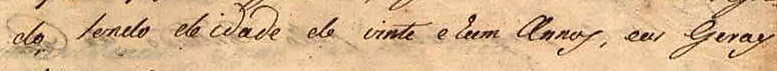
do sendo de idade de vinte e hum Annos, e as Geraes
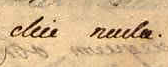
dice nada.
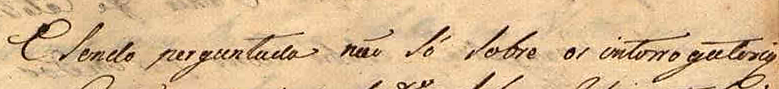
E sendo perguntado naõ só sobre os interrogatorios
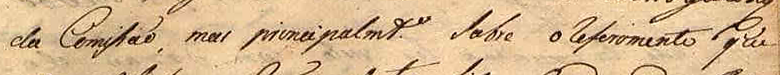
da Comissaõ, mas principalmt.e Sobre o Referimento que
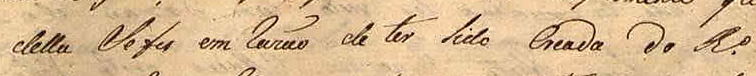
della Se fes em Razaõ de ter sido Creada do R.o
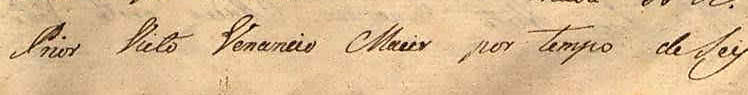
Prior Vito Venancio Maier por tempo de Seis
